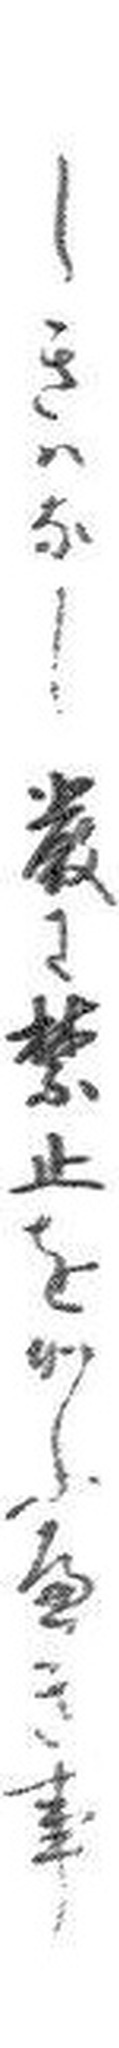しきはなし厳に禁止を加ふへき事
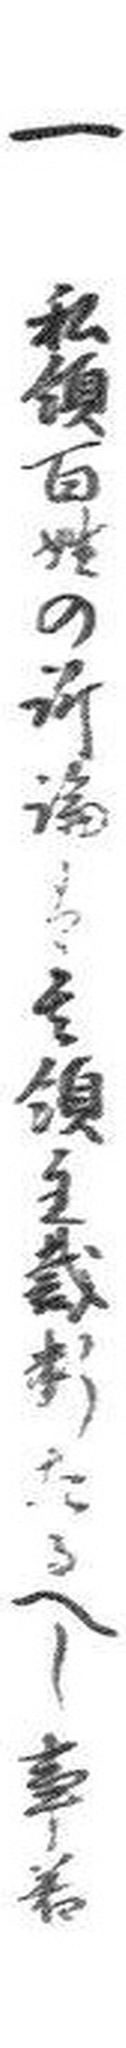一私領百姓の訴論は其領主裁断たるへし事若
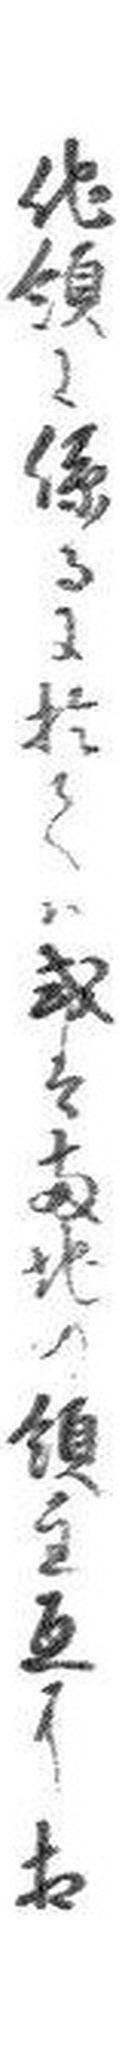他領に係るに於ては或は両地の領主互に相
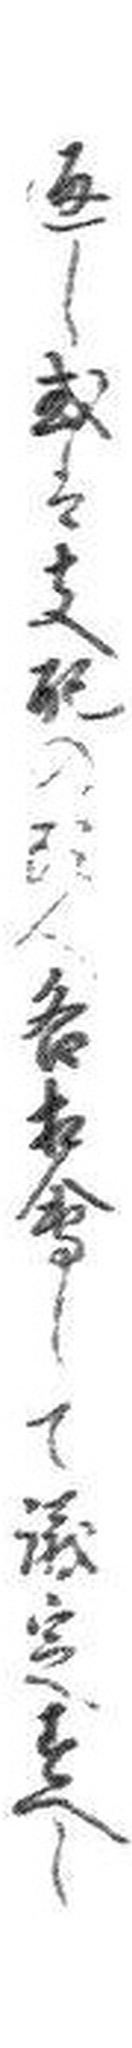通し或は支配の頭人各相会して議定すへし
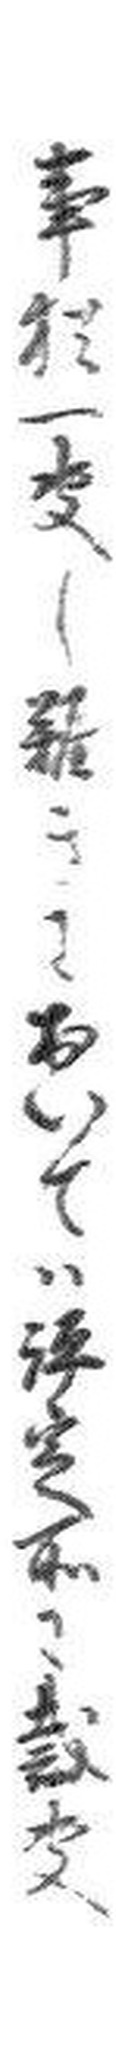事猶一決し難きにおいては評定所に裁決
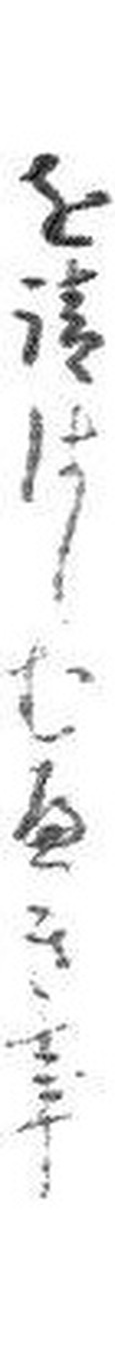を請けしむへき事
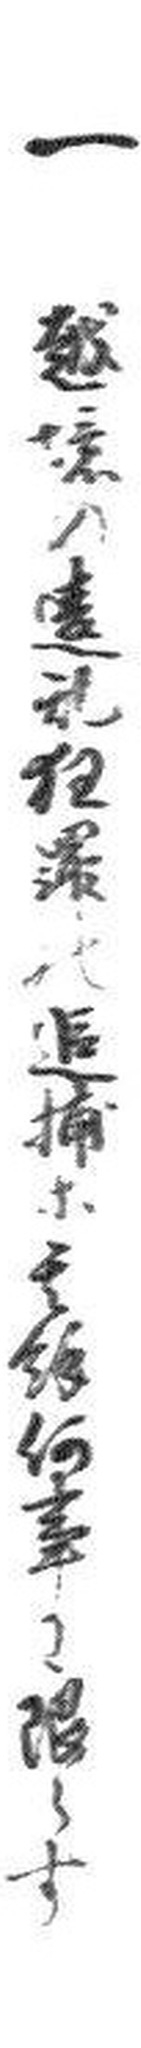一越境の違乱狂罪の追補等其余何事に限らす

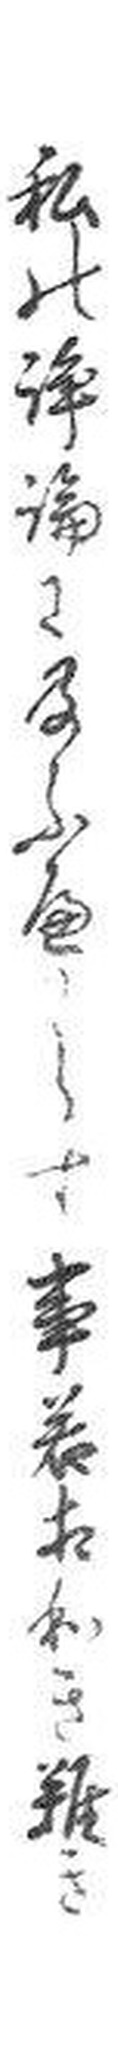私の評論に及ふへからす事若相和き難き
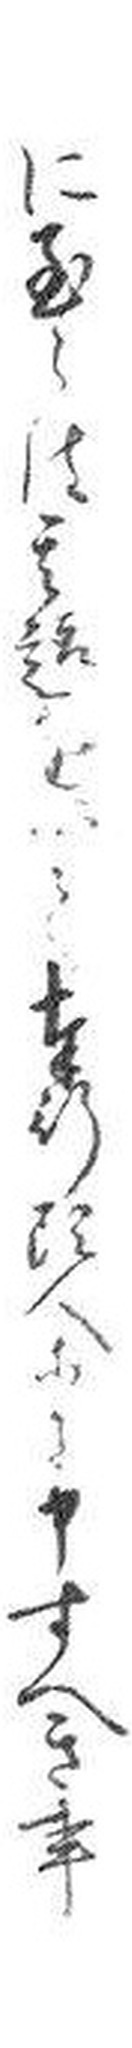に至らは其趣を以て奉行頭人等に申すへき事
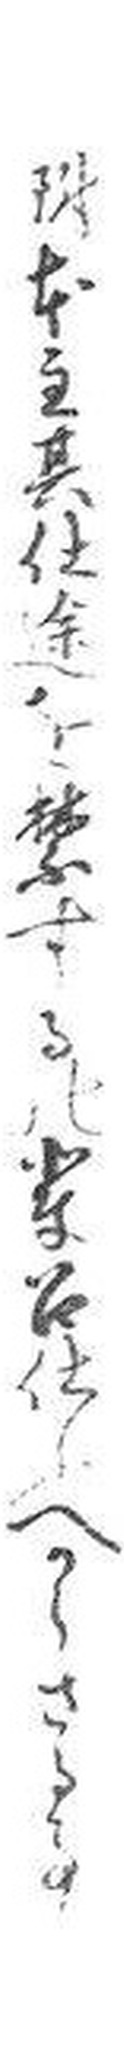附本主其仕途を禁するの輩召仕ふへからさる事
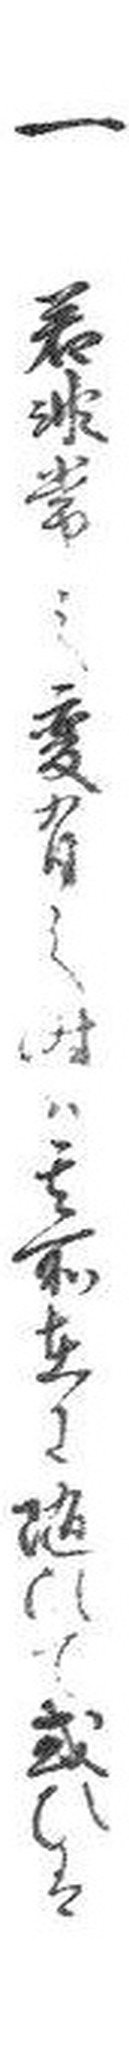一若非常之変有之時は其所在に随ひて或ひは
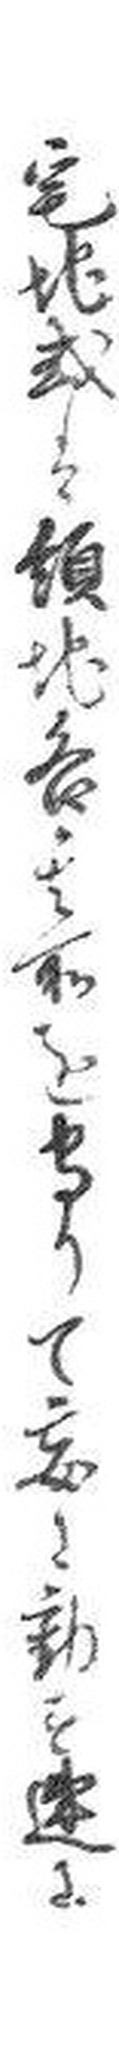宅地或は領地各其所を守りて妄に動す速に
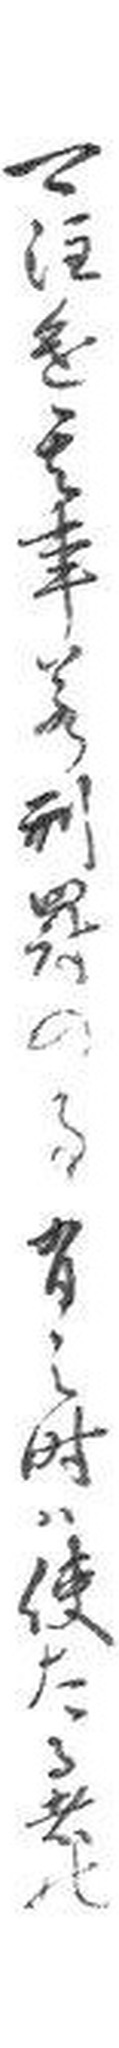可注進其事若刑罰の事有之時は使たる者の
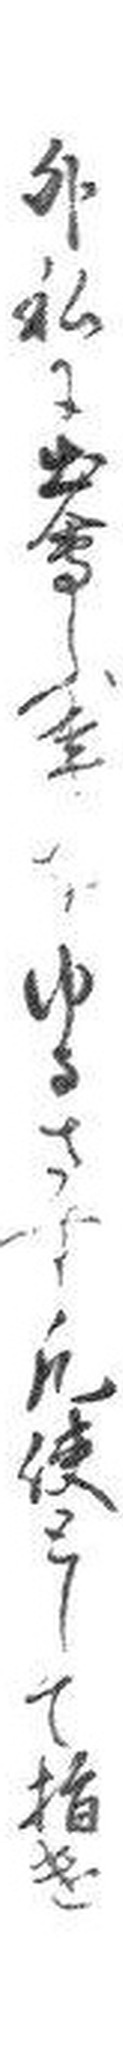外私に出会ふ事をゆるさす凡使として指遣
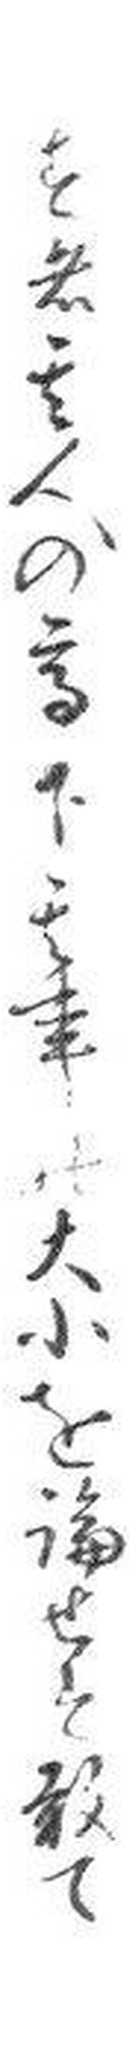す者其人の高下其事の大小を論せす敢て
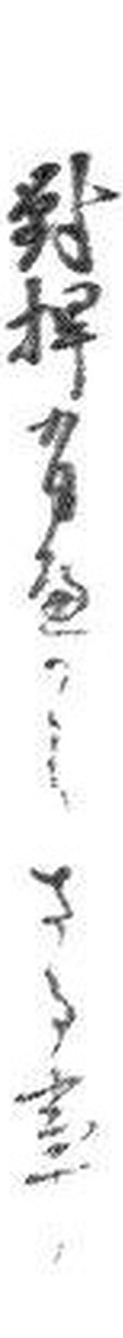対捍有へからさる事
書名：家譜 二十五 吉品公 従宝永六年到同七年
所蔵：福井県文書館 Fukui Prefectural Archives
